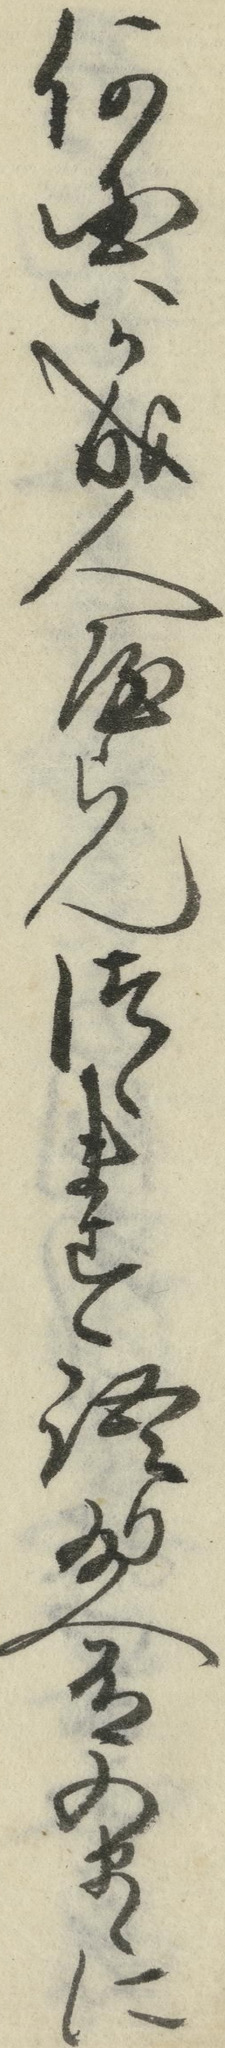何国いか成人やらんつゝます語り給へ有のまゝに
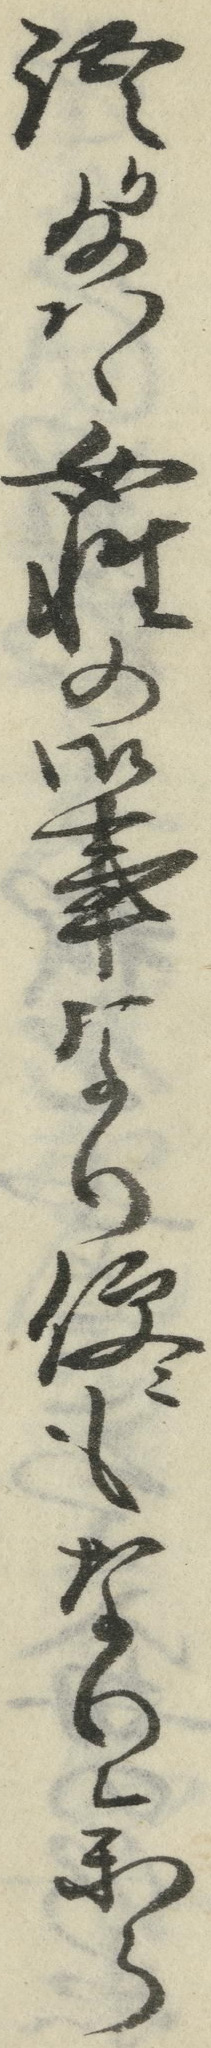語り給ハゝ女性の御事なり便二もなり参ら
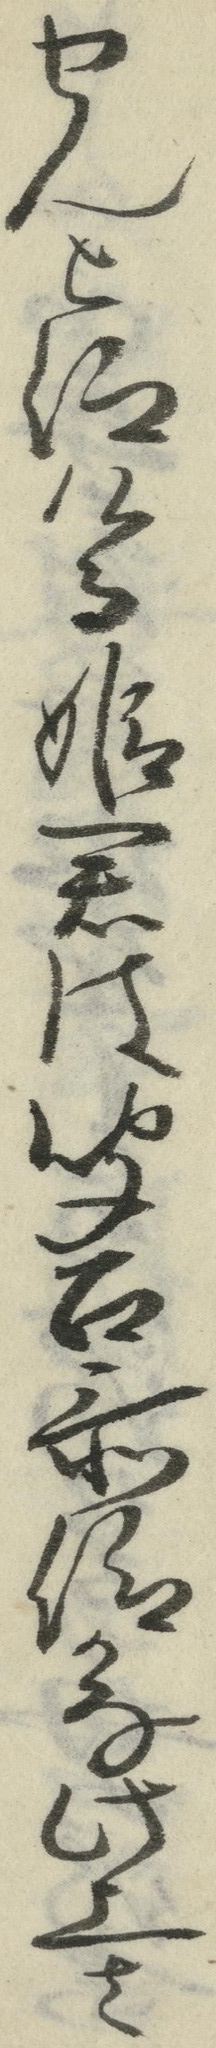せんと仰ける姫君は聞召忝仰かな此上は
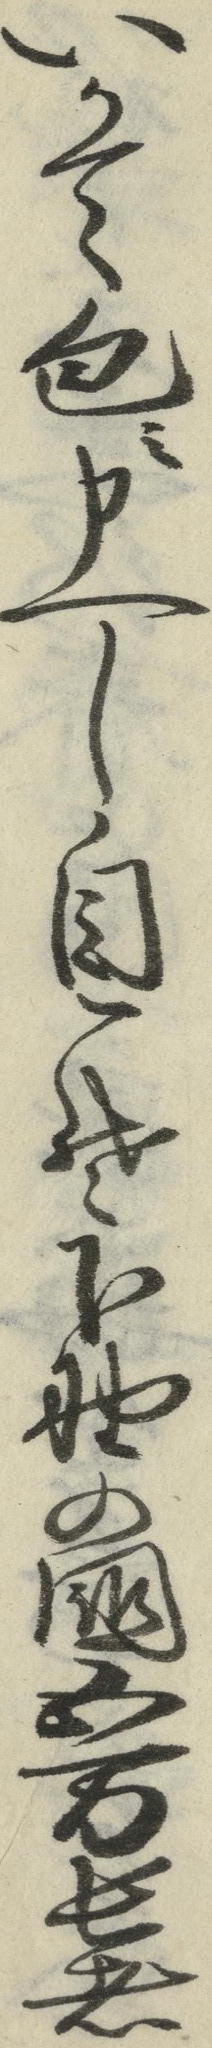いかて包ミ申へし自こそ下野の国五万長者
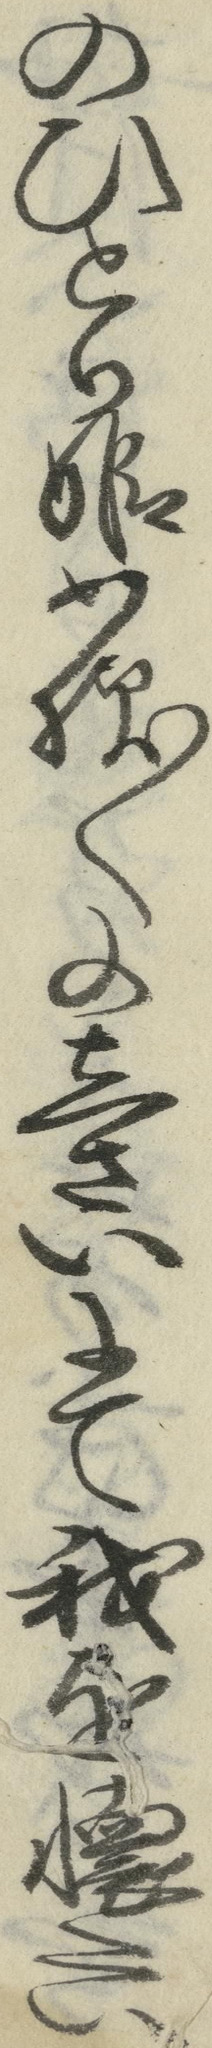のひとり姫か様〳〵のしさいにて我を懐たい
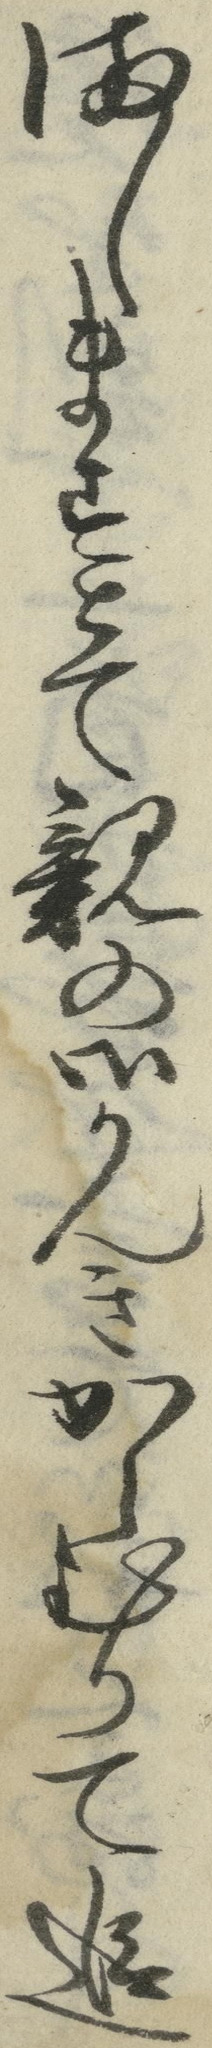ましますとて親の御かんきかうむりて追
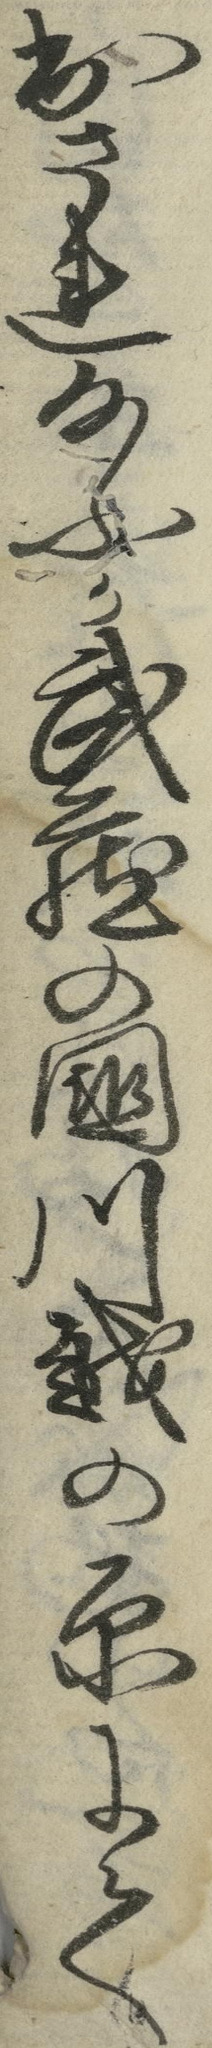出され給ふか武蔵の国川越の原にて

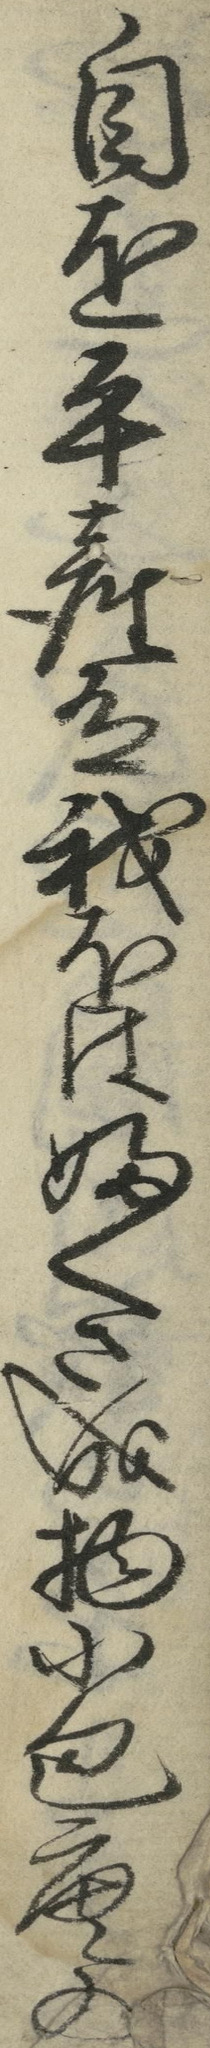自を平産有我をはふくさ成物に包唐の
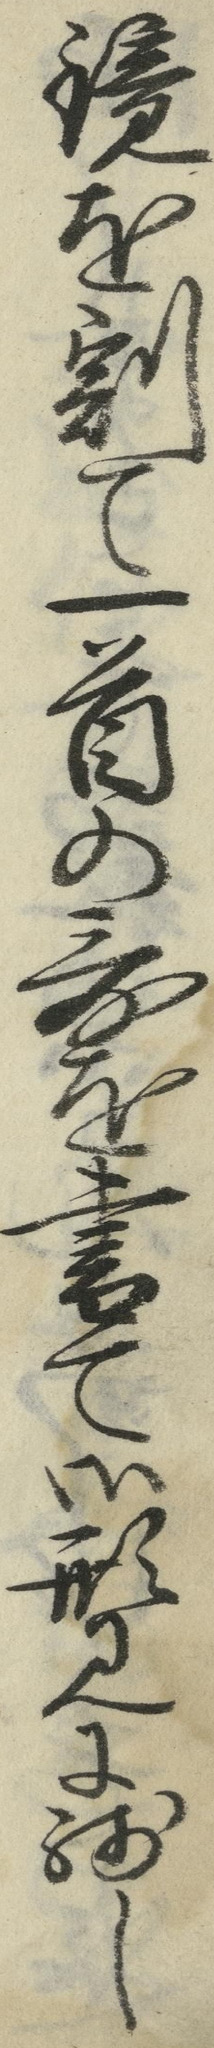鏡を割て一首の歌を書て御形見に残し
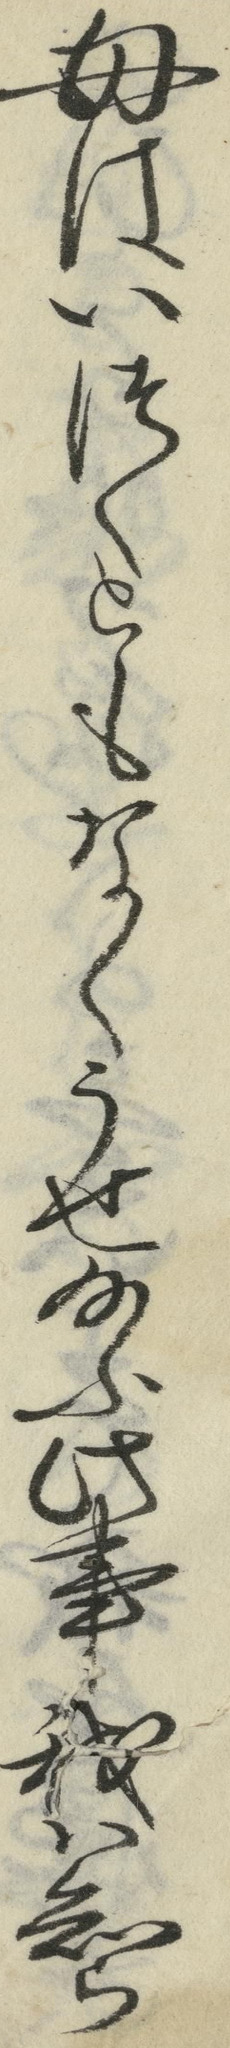母はいつくともなくうせ給ふ此事我ハ知ら
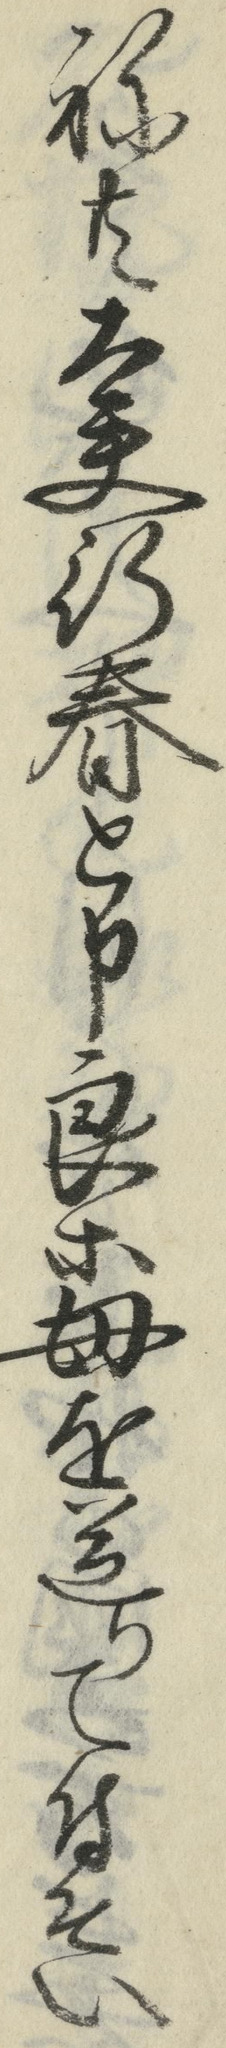ね共太夫行春と申良等母を送りて付そい
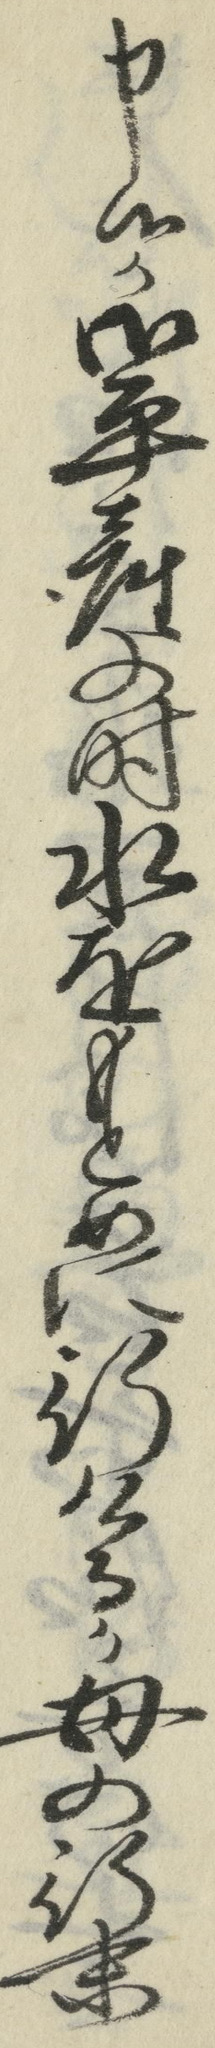申候か御平産の時水をもとめに行けるか母の行末
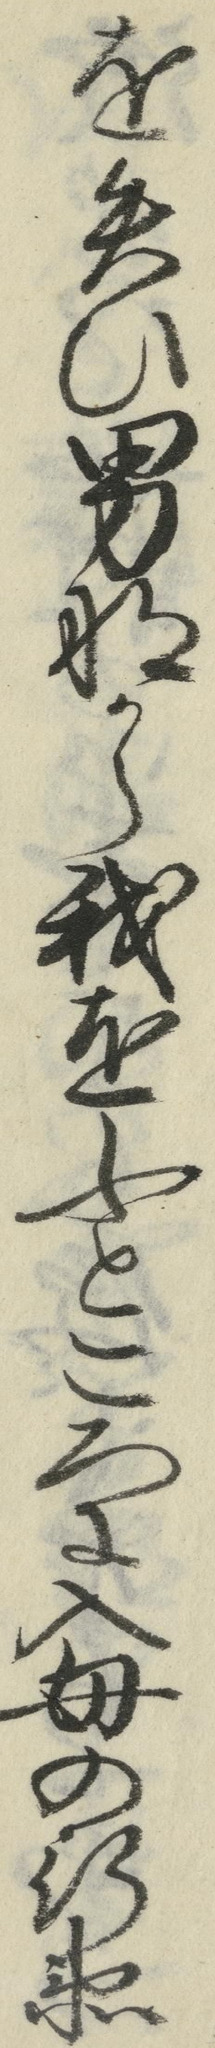を失ひ男なから我をふところに入母の行衛
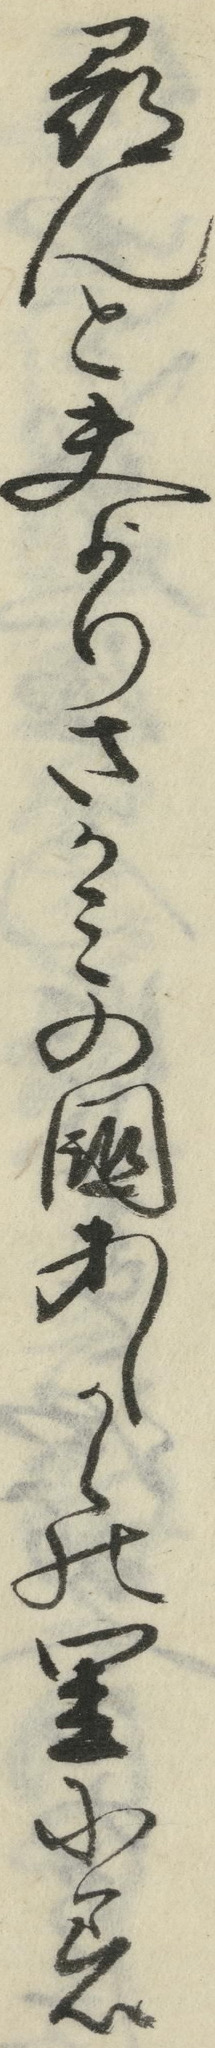尋んと夫よりさかみの国あしからの里に着
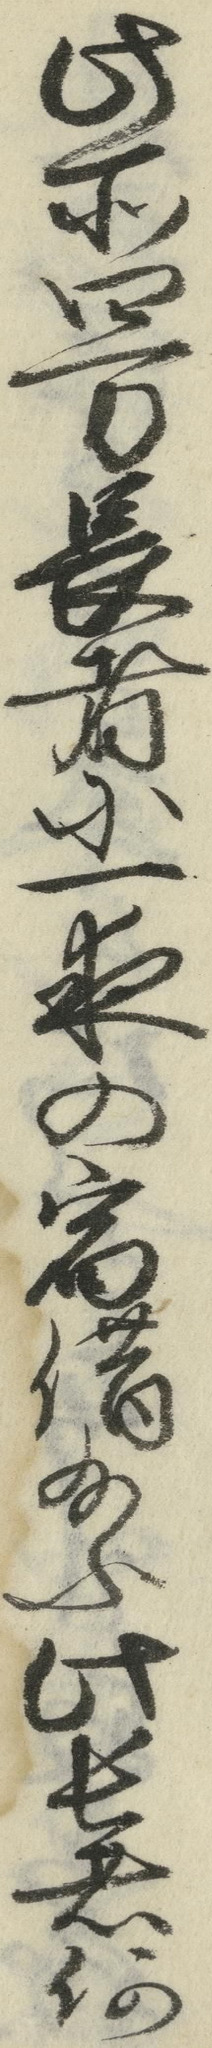此所四万長者に一夜の宿借給ふ此長者何
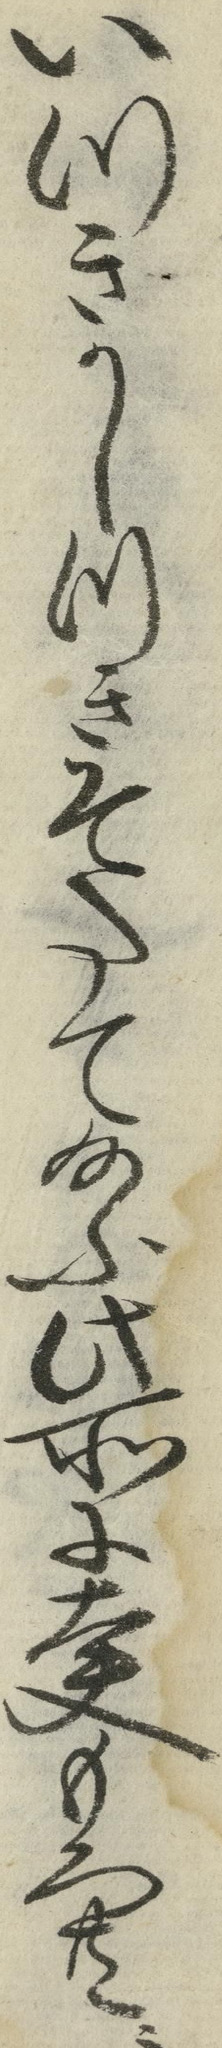いつきかしつきそたて給ふ此所に太夫もろ共ニ
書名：浅間記
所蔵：東京大学地震研究所図書室 Earthquake Research Institute Library, The University of Tokyo, JAPAN
